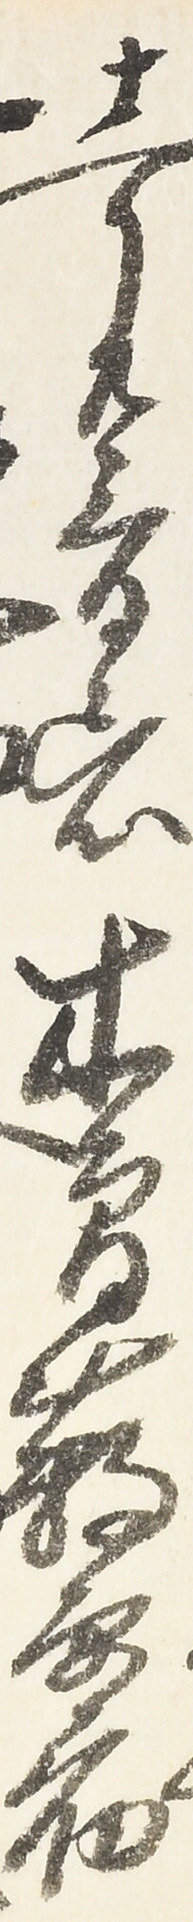十二月廿三日着木曽藪原宿
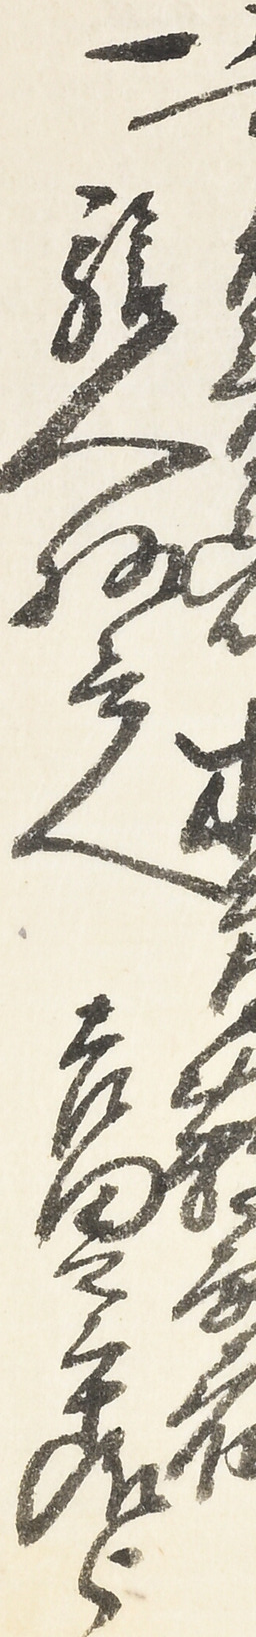一旅人拾壱人吉田や平治郎
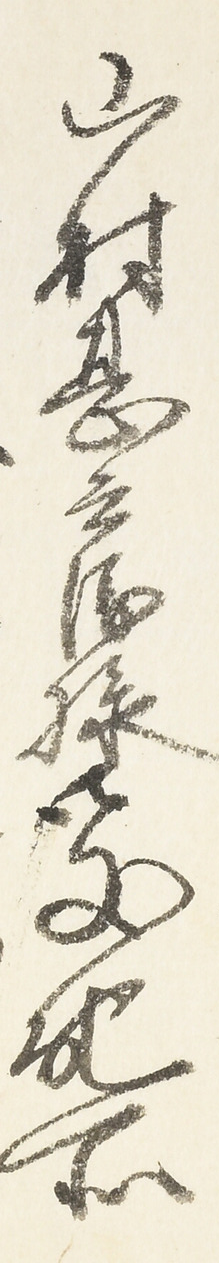山村甚兵衛様御支配所
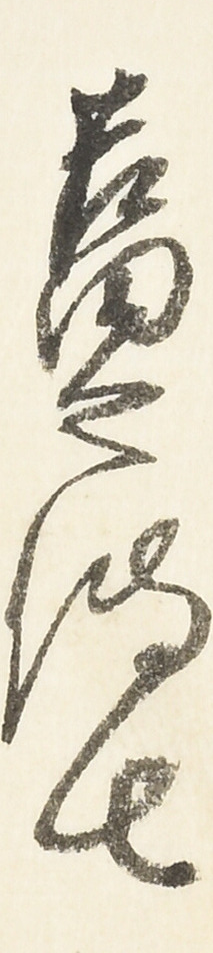吉田や伝七
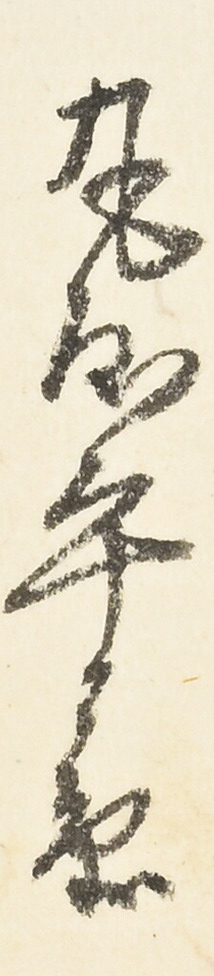丸屋平兵衛
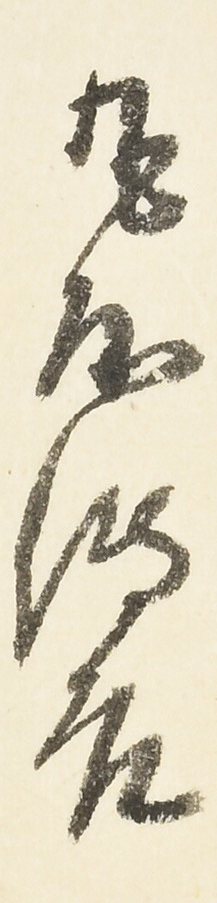丸屋伝吉
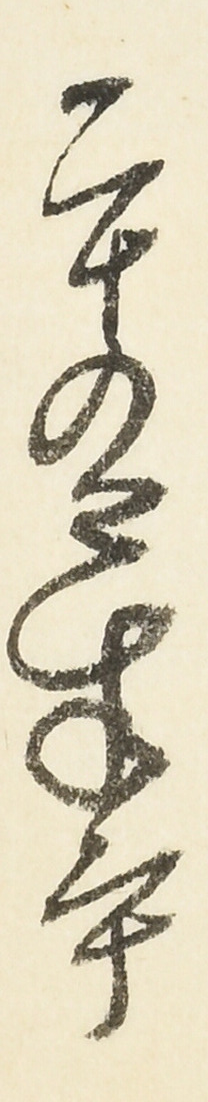平のや半平

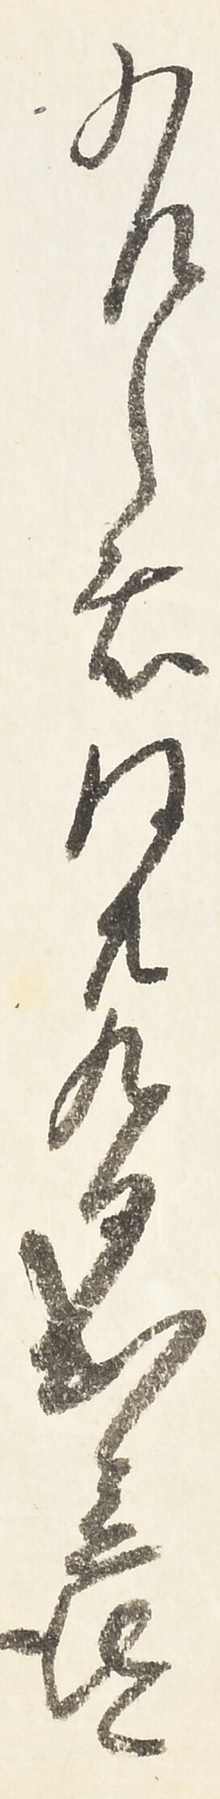右之者同廿九日出立仕候
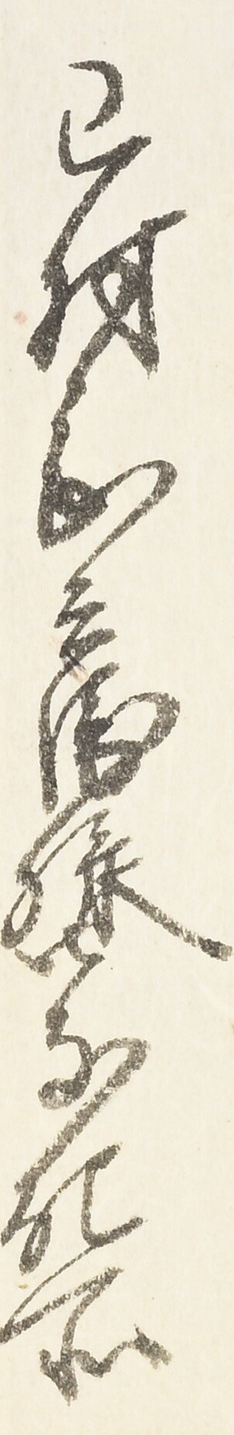山村甚兵衛様御支配所
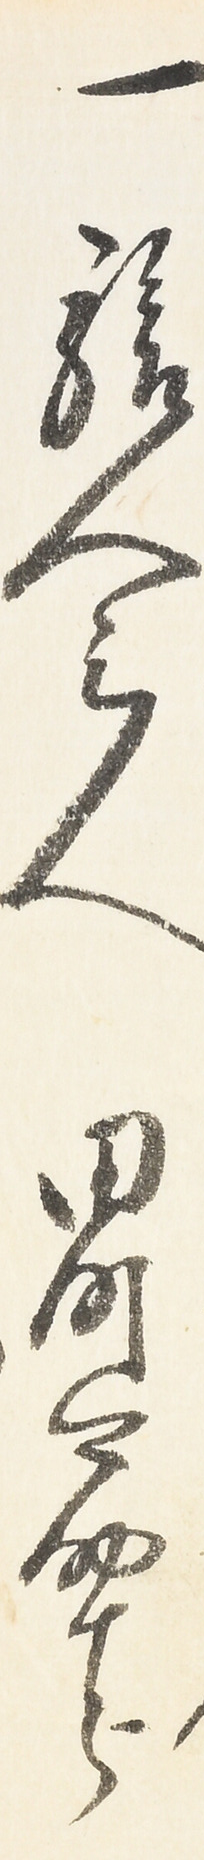一旅人三人田町や助十郎
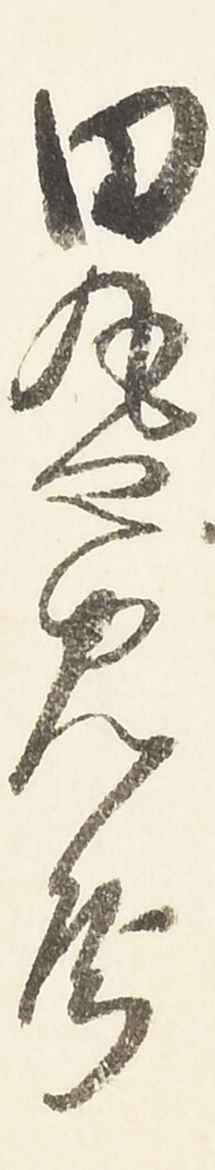田丸や忠蔵
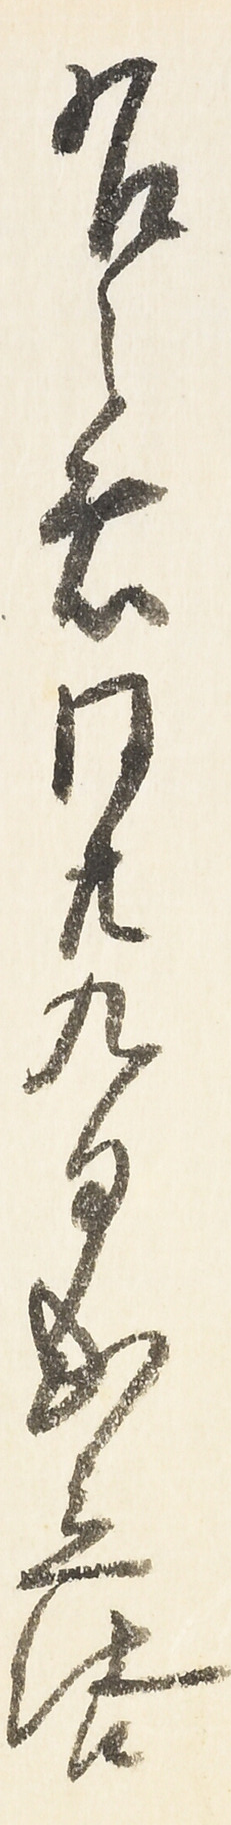右之者同廿九日出立仕候
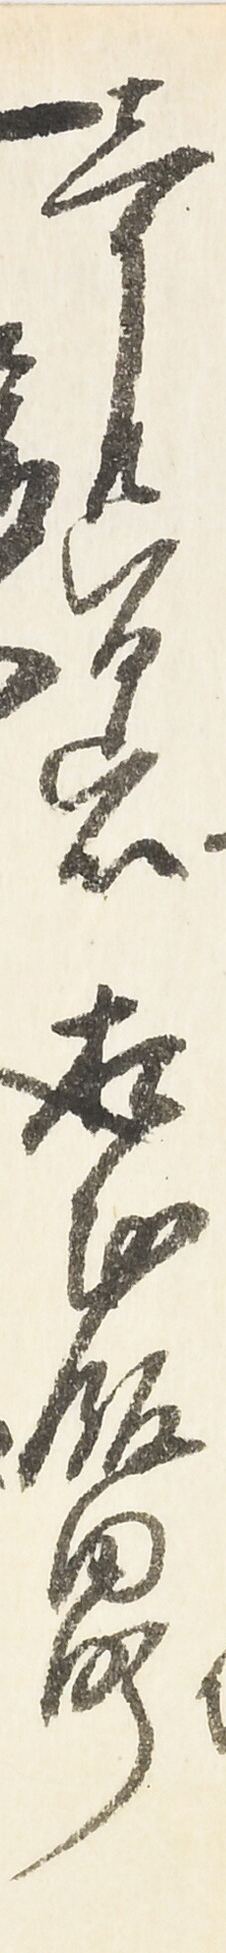十二月廿八日着松本飯田町
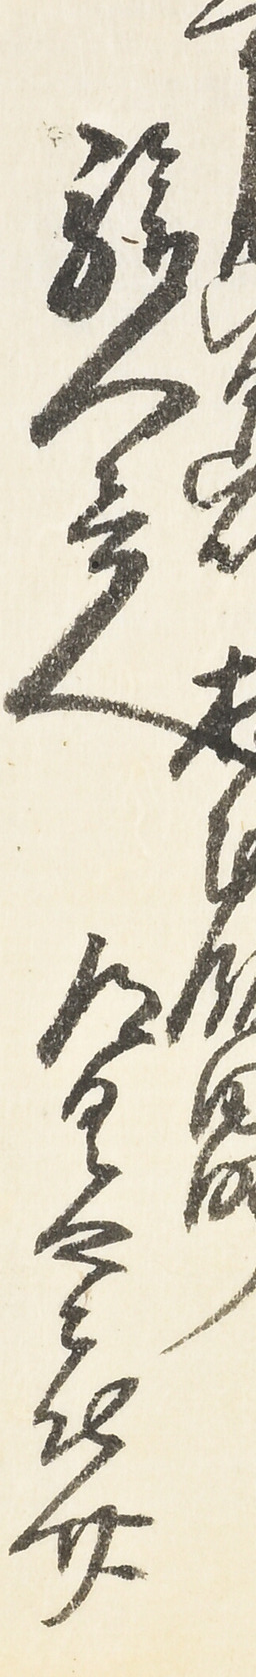一旅人壱人道具や喜介
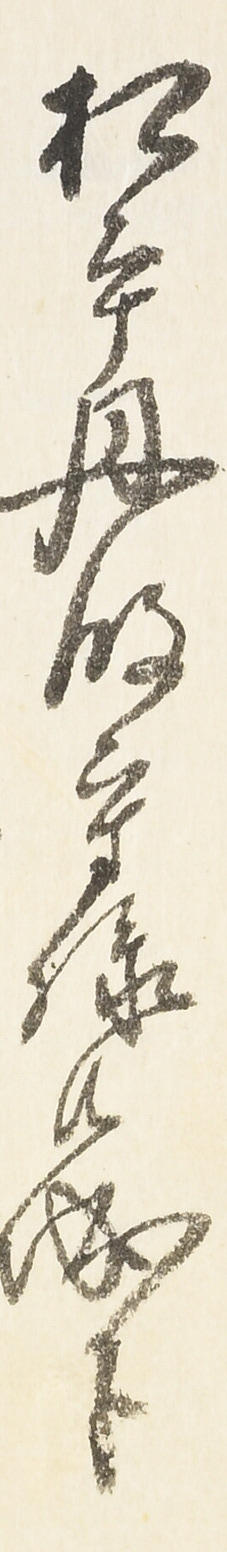松平丹波守様御城下
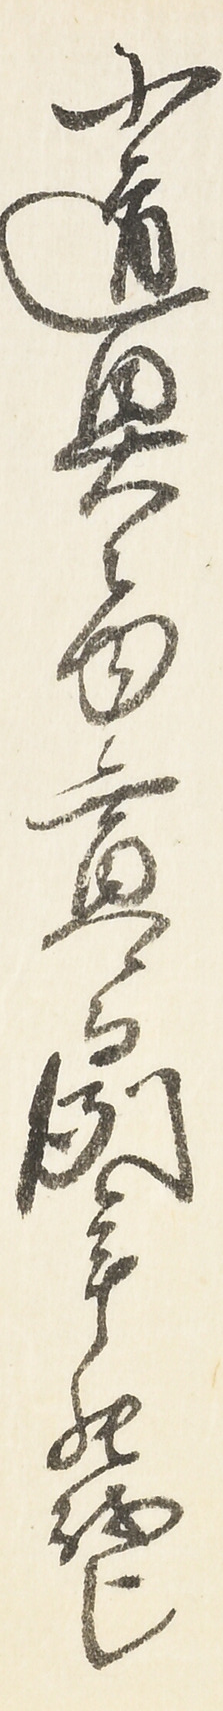小道具商売ニ而例年罷越申候
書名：町中旅人泊控帳
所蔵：伊那市立高遠町図書館・合同会社AMANE
